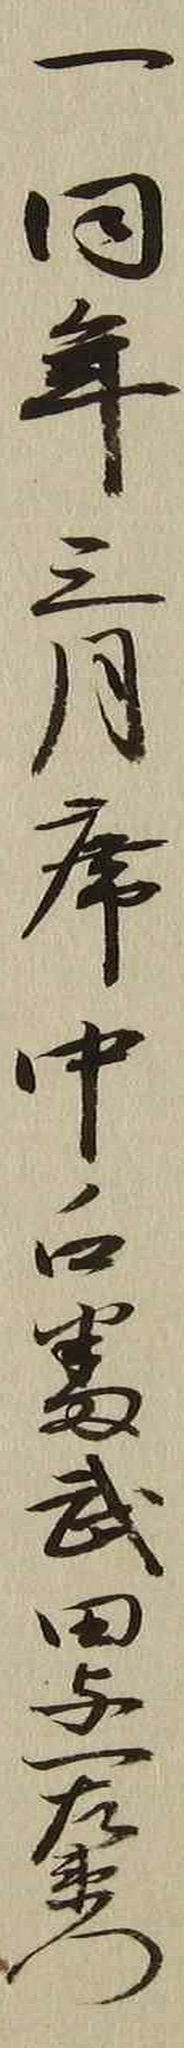一同年三月席中ノ口番武田与一左衛門
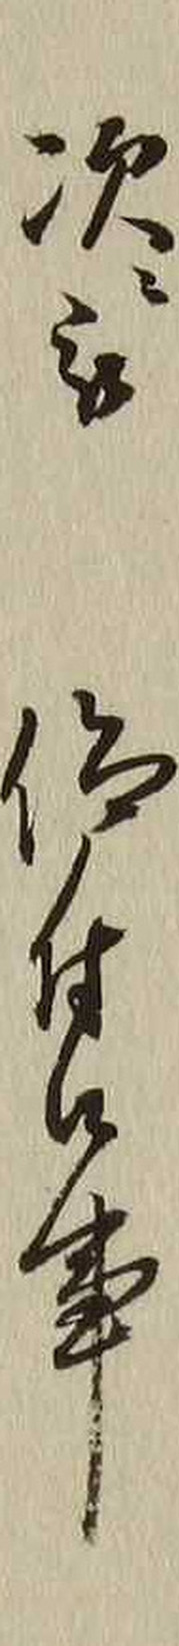次ニ被仰付候事
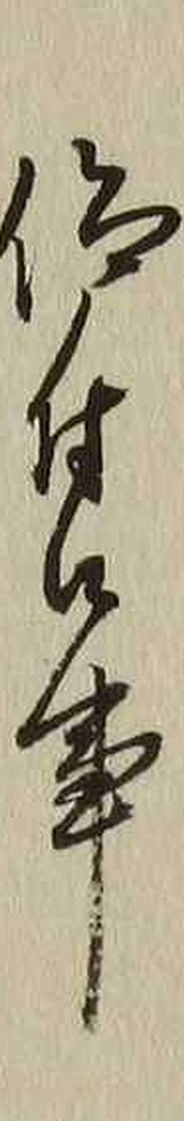仰付候事
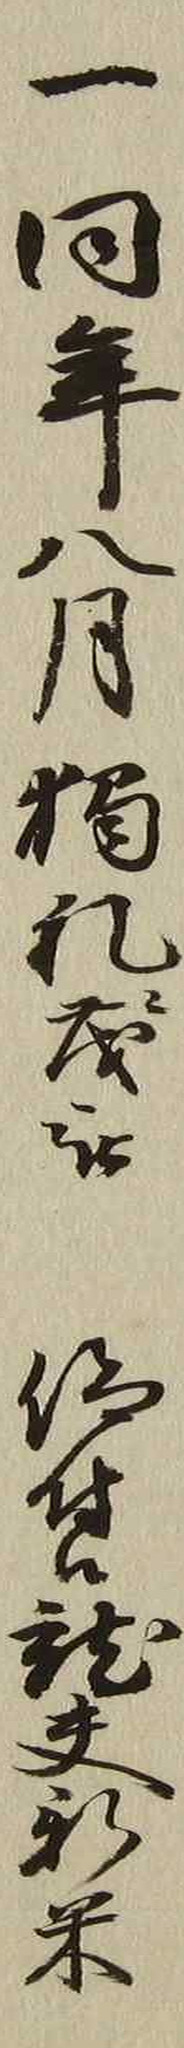一同年八月独礼ニも被仰付候就夫新米
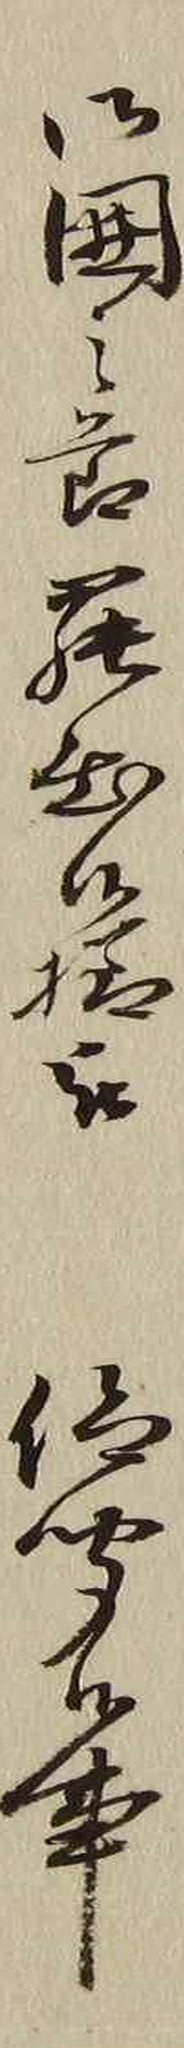御囲之節罷出候様被仰聞候事
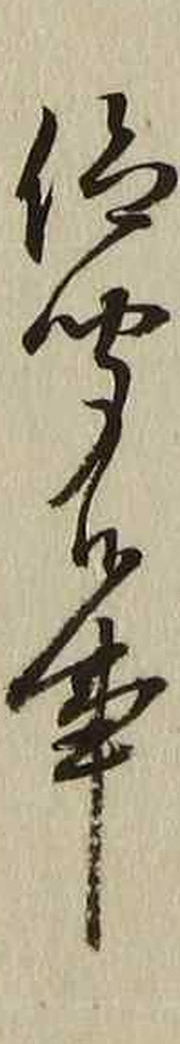仰付候事
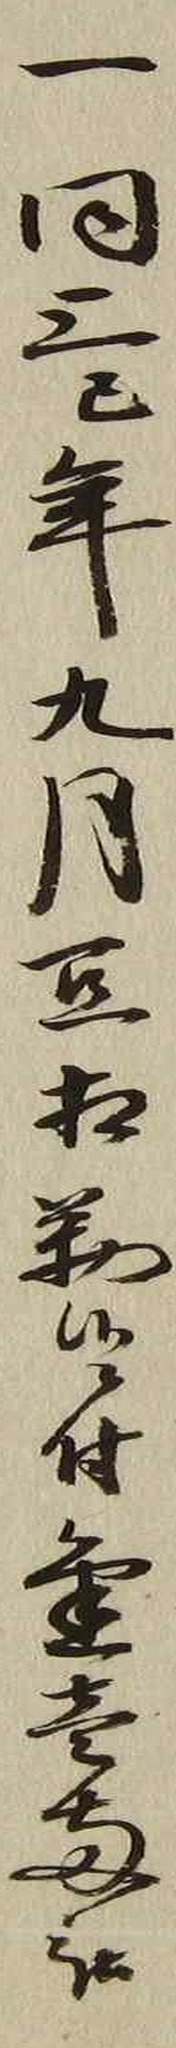一同三巳年九月宜相勤候ニ付金壱両被
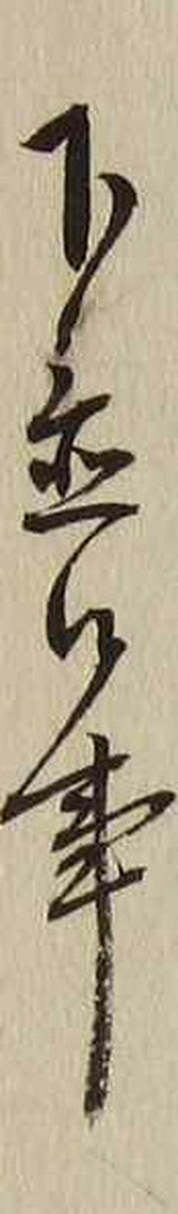下置候事
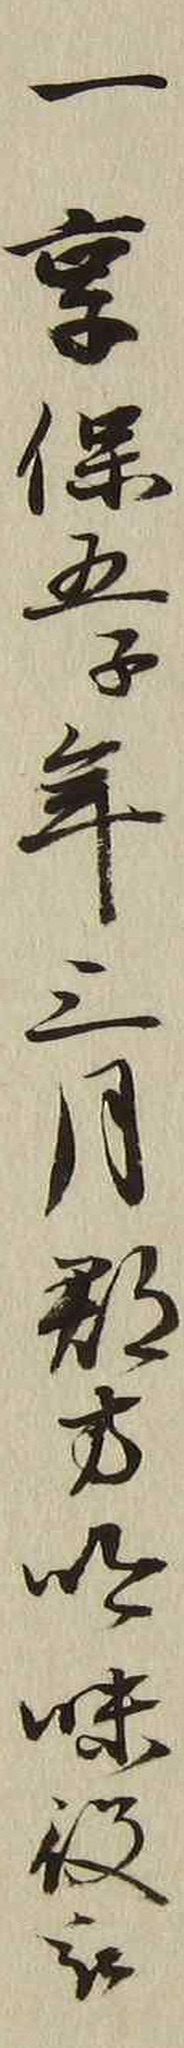一享保五子年三月郡方吟味役被
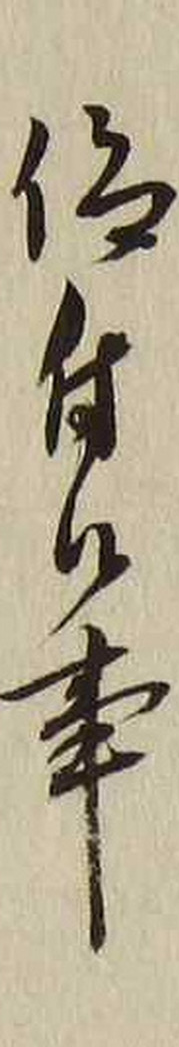仰付候事
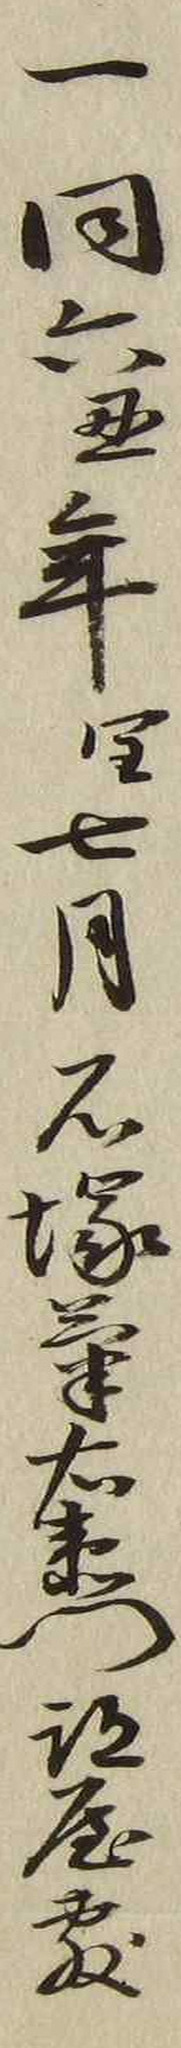一同六丑年閏七月石塚菊右衛門跡屋敷
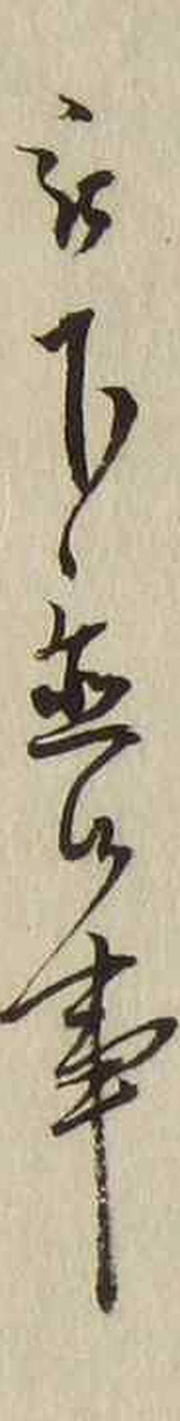被下置候事

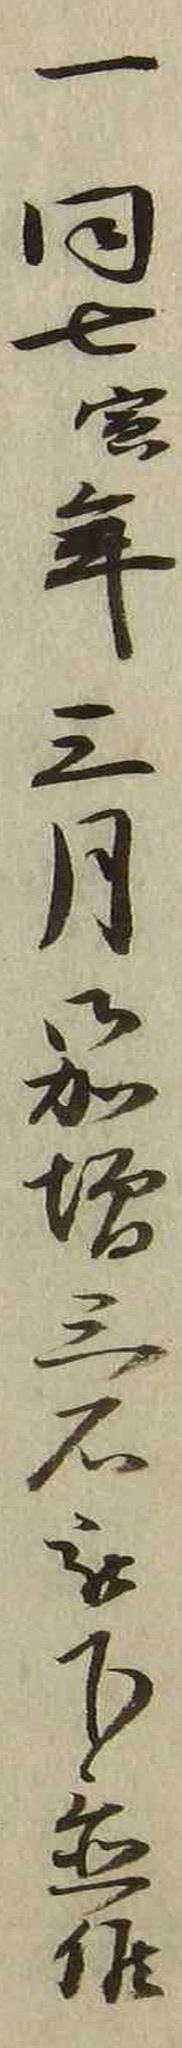一同七寅年三月御加増三石被下置候
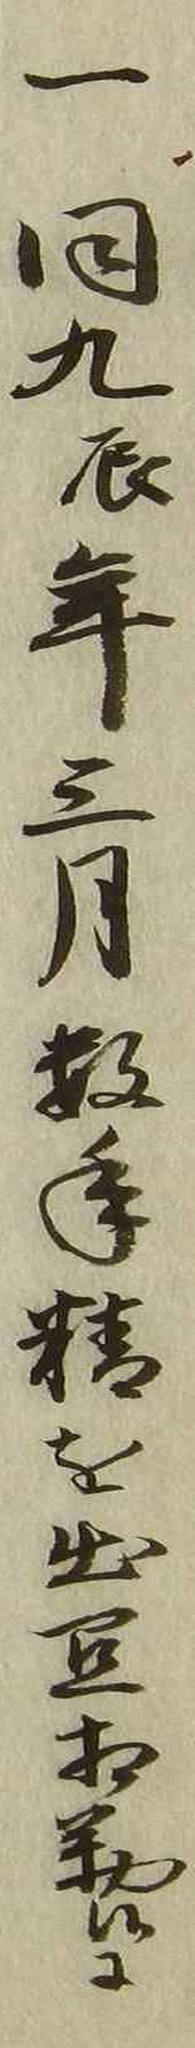一同九辰年三月数年精を出宜相勤候ニ
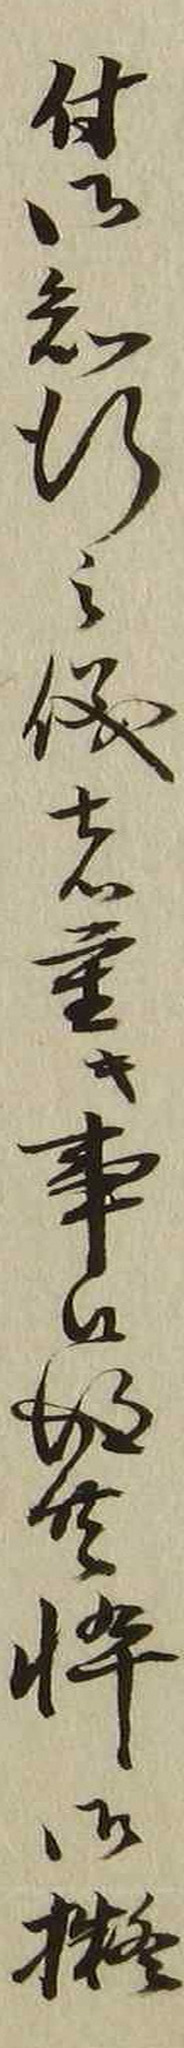付御知行之儀者重キ事候得共忰御擬
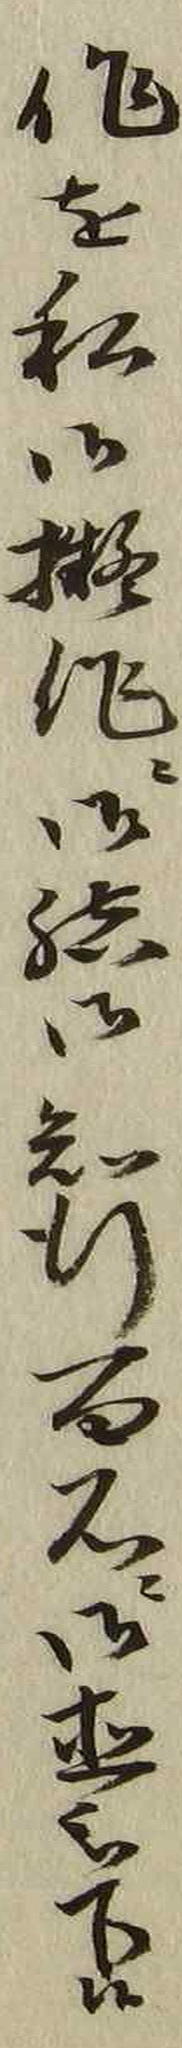作を私御擬作ニ御結御知行百石ニ御直被下候
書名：諸士系譜　巻之61　と之部4
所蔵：会津若松市立会津図書館
